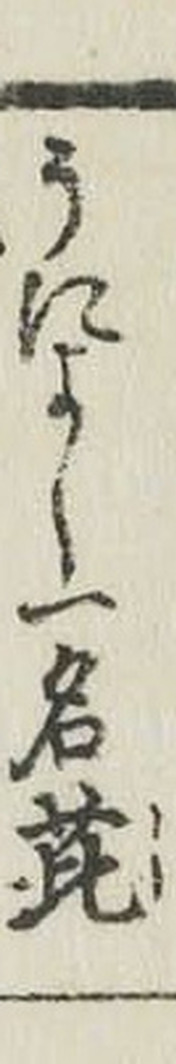うによし一名芘
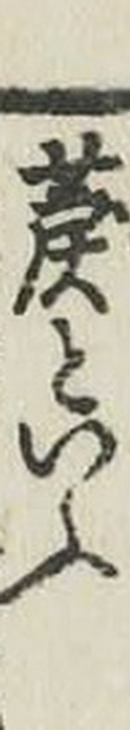䓞といふ
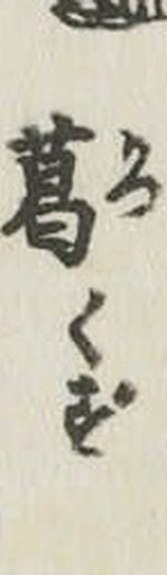葛くず
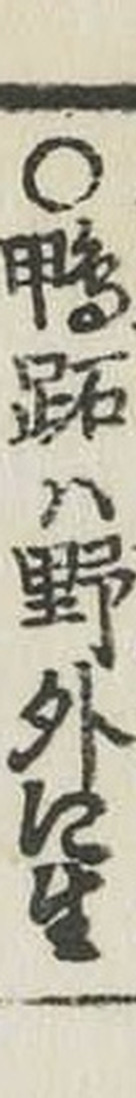○鴨跖は野外に生
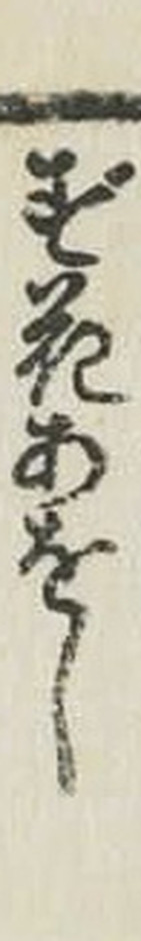ず花あをし
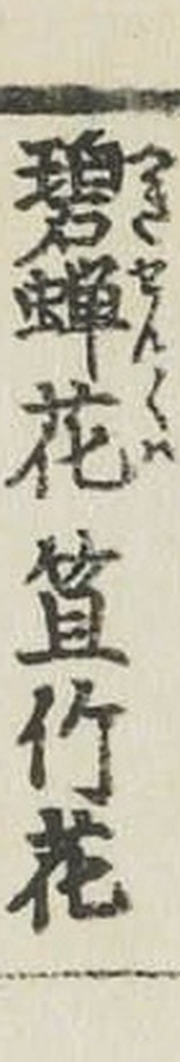碧蝉花笪竹花
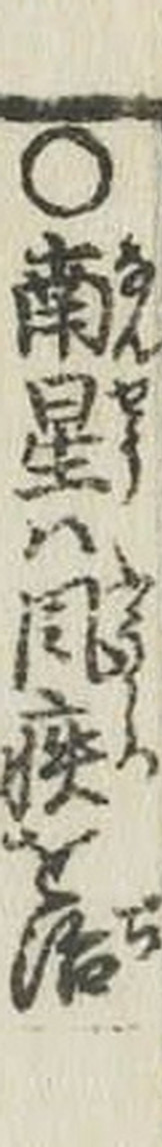○南星は風疾を治
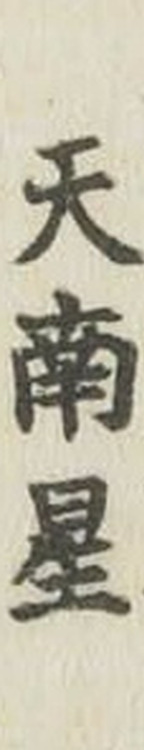天南星
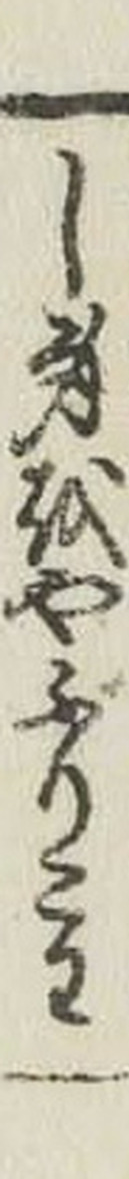し身をやぶりこわ
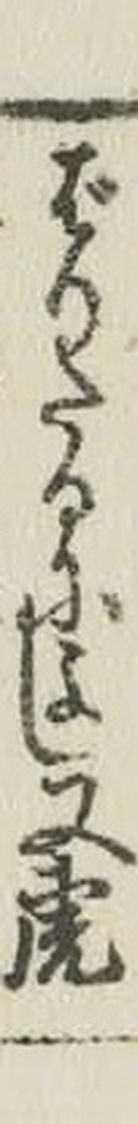ばりたるによし又虎
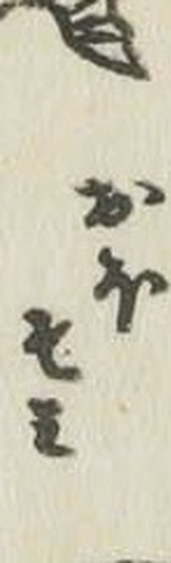おほそみ
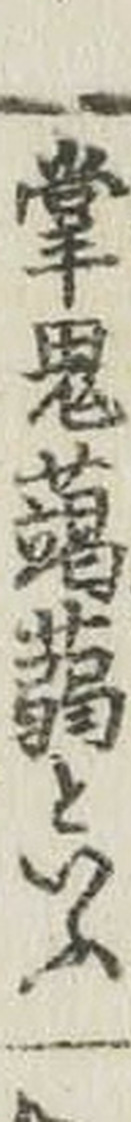掌鬼蒟蒻といふ
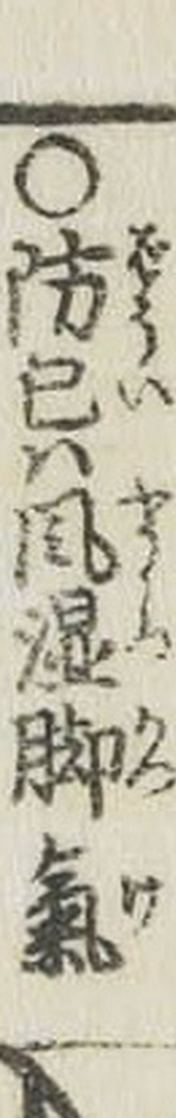○防已は風湿脚気
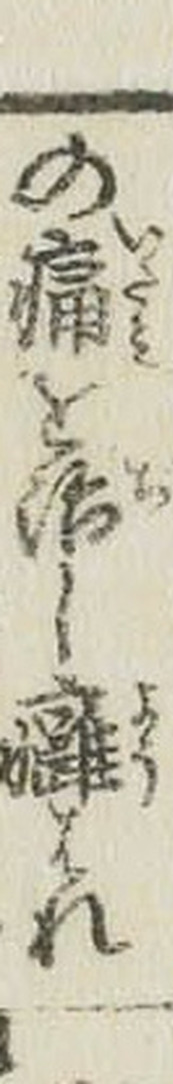の痛を治し癰はれ
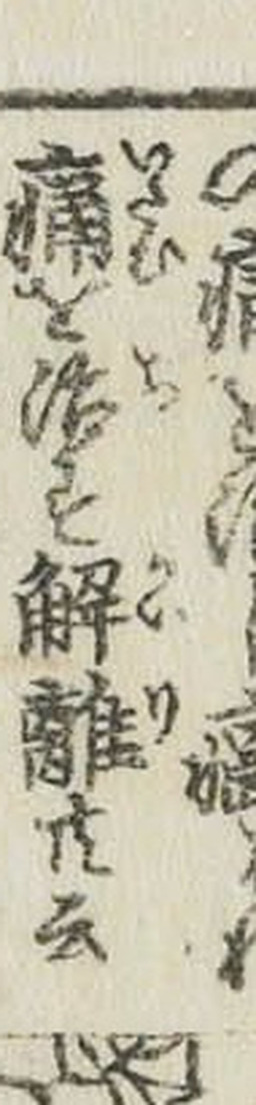痛を治す解離共云
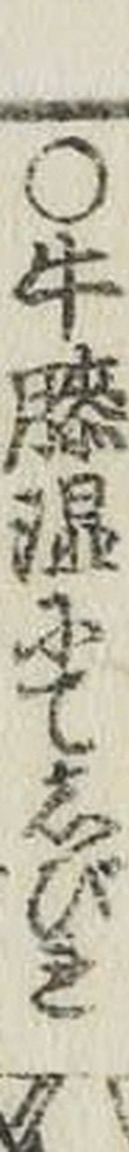○牛膝湿にてしびれ
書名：増補頭書訓蒙図彙大成 10巻 9:巻之20
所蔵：東京学芸大学教育コンテンツアーカイブ
